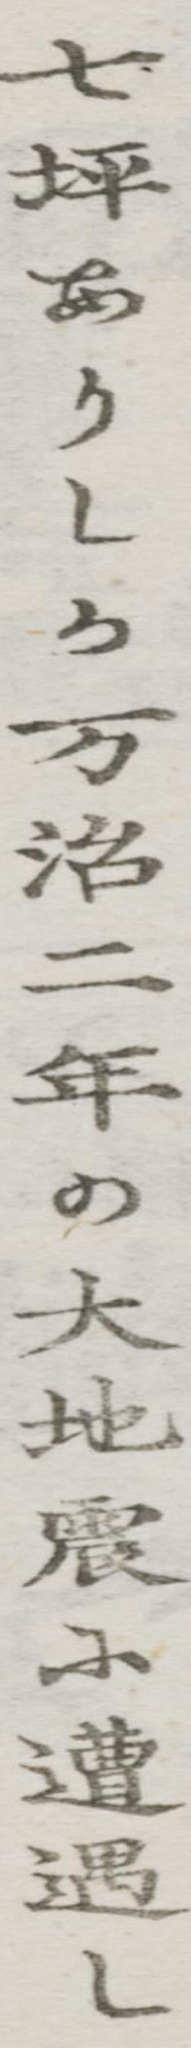七坪ありしか万治二年の大地震に遭遇し
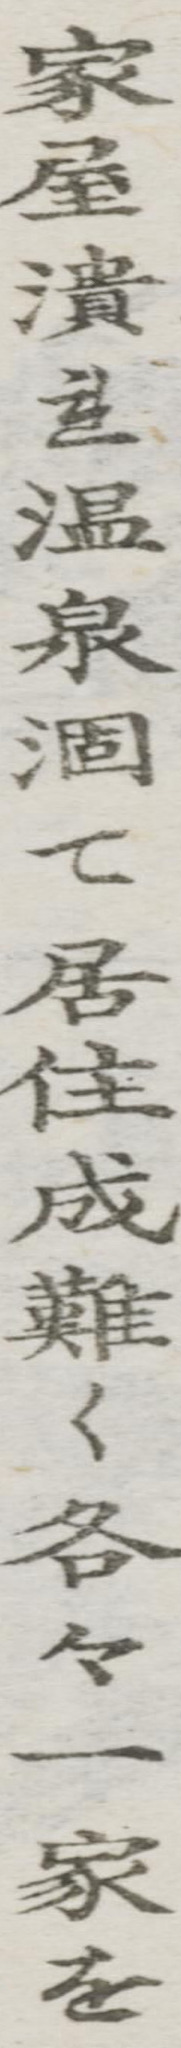家屋潰れ温泉涸て居住成難く各々一家を
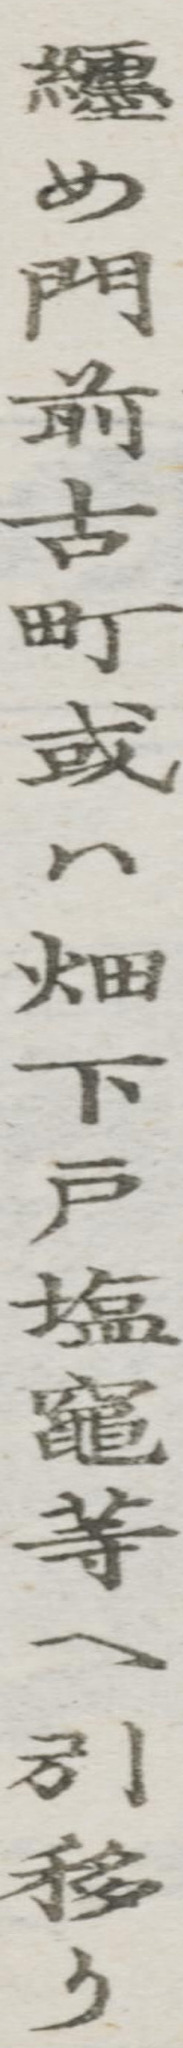纏め門前古町或は畑下戸塩竈等へ引移り
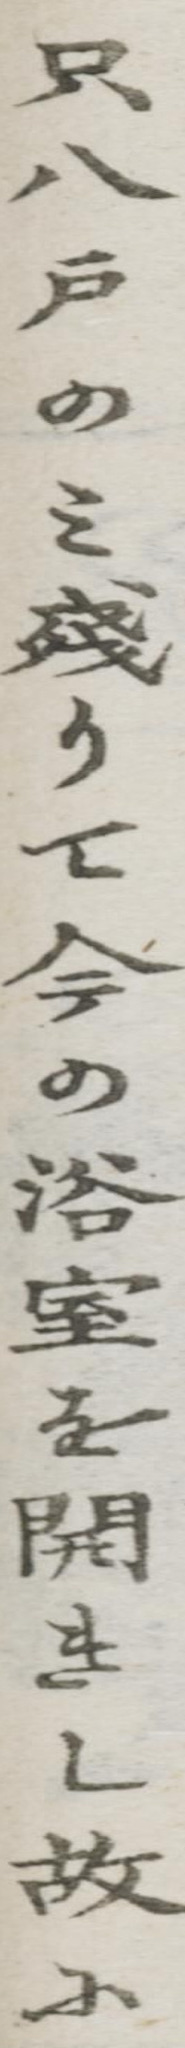只八戸のみ殘りて今の浴室を開きし故に
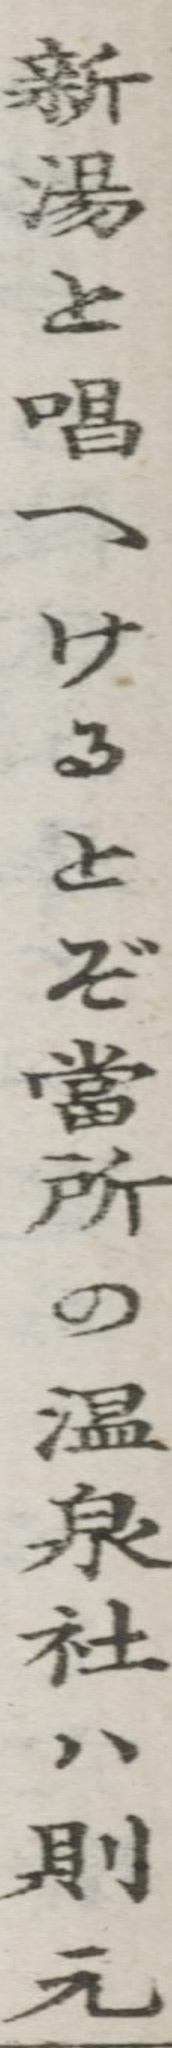新湯と唱へけるとぞ當所の温泉社は則元
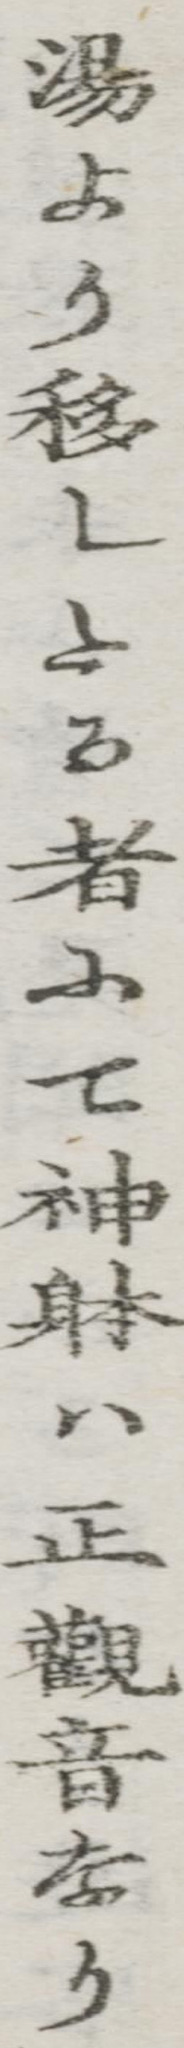湯より移したる者にて神躰は正観音なり
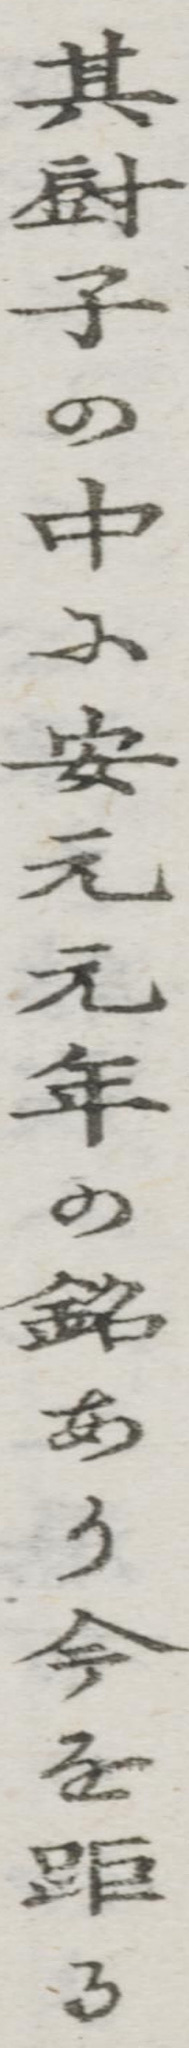其厨子の中に安元元年の銘あり今を距る
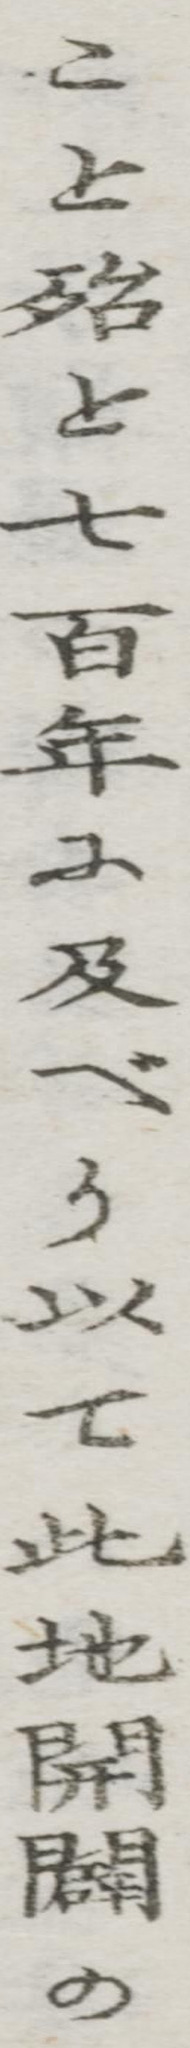こと殆と七百年に及べり以て此地開闢の
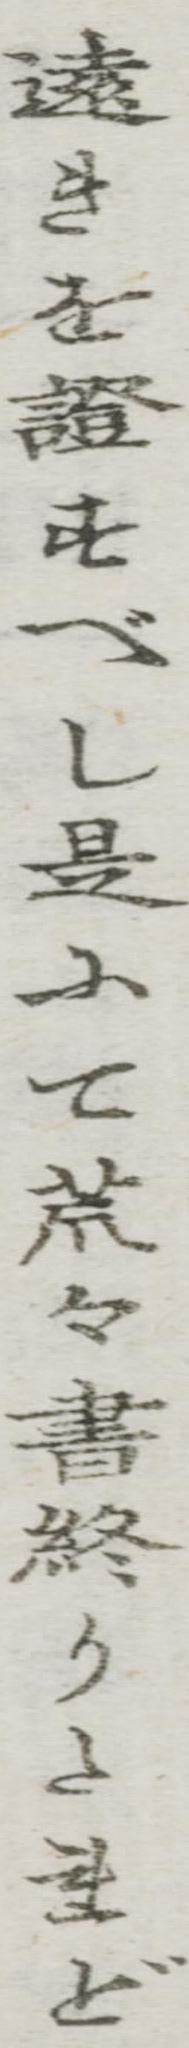遠きを證すべし是にて荒々書終りたれど
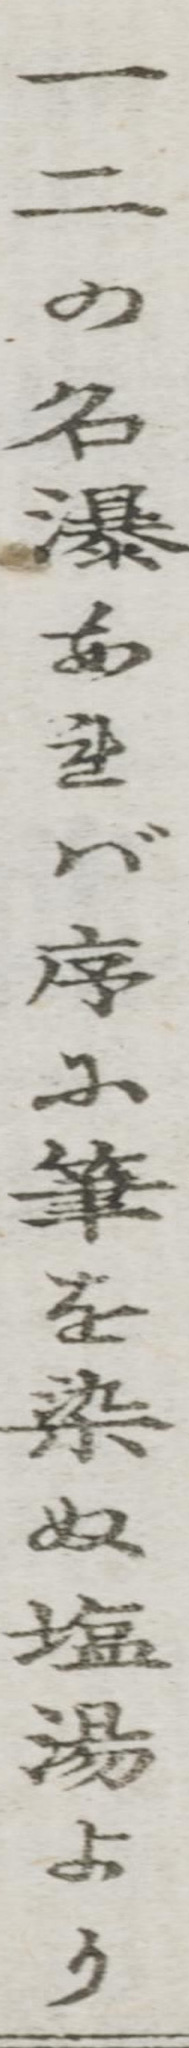一二の名瀑あれば序に筆を染ぬ塩湯より
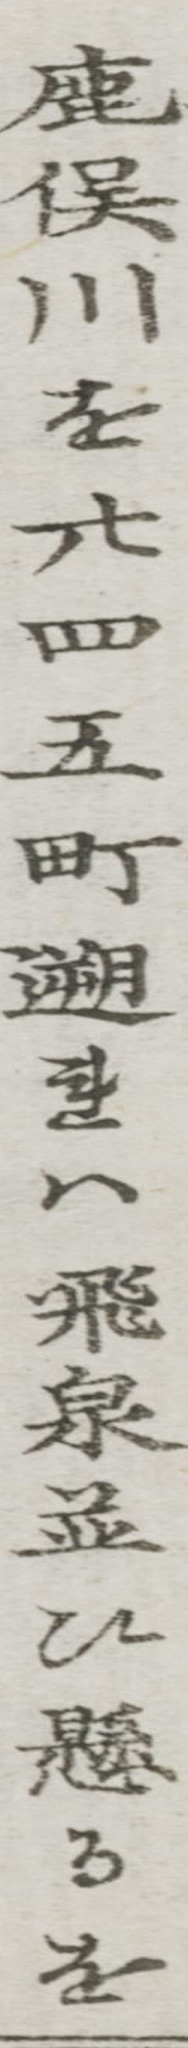鹿俣川を廿四五町遡れは飛泉並ひ懸るを
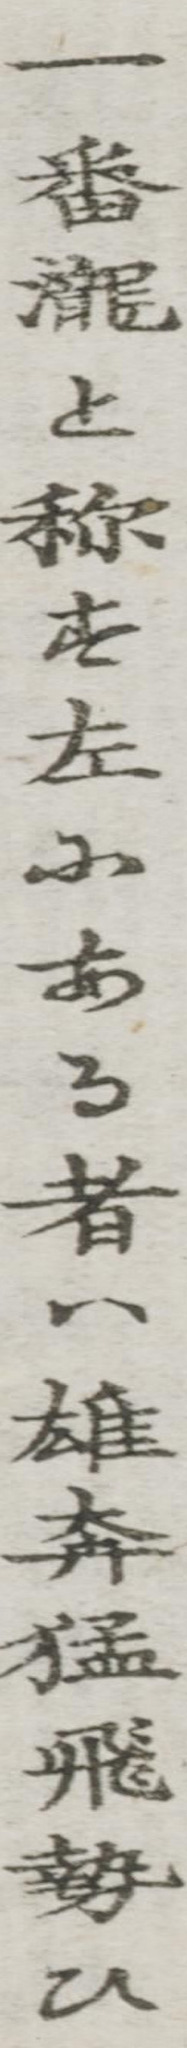一番瀧と称す左にある者は雄奔猛飛勢ひ

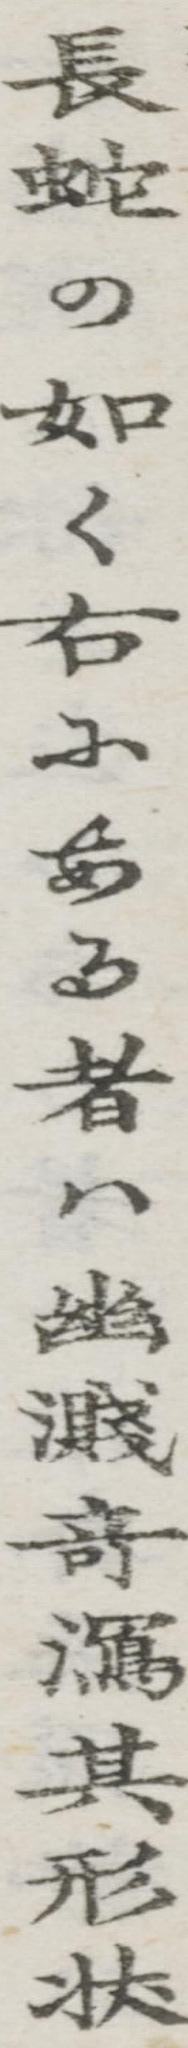長蛇の如く右にある者は幽濺奇瀉其形状
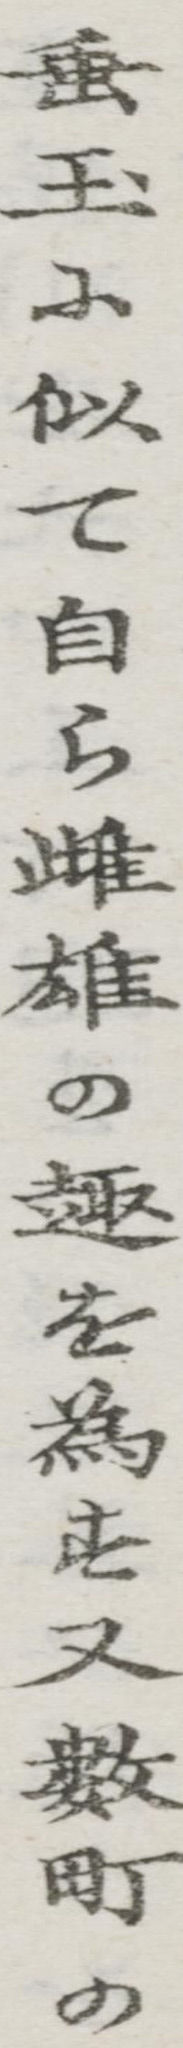垂玉に似て自ら雌雄の趣を為す又数町の
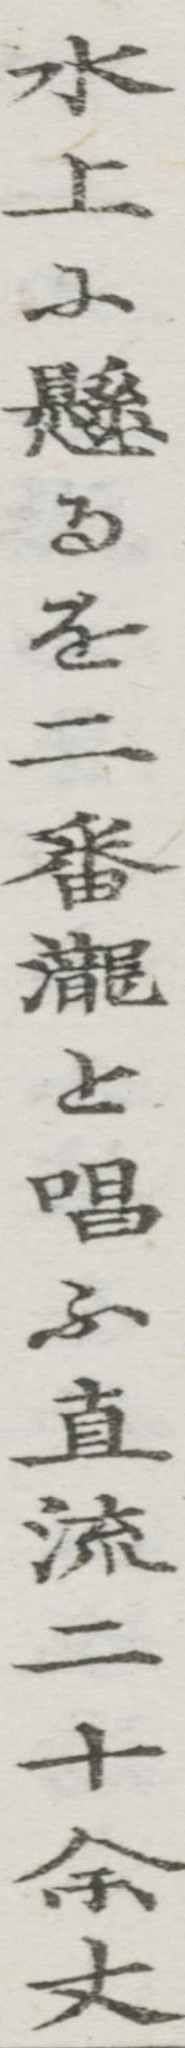水上に懸るを二番瀧と唱ふ直流二十余丈
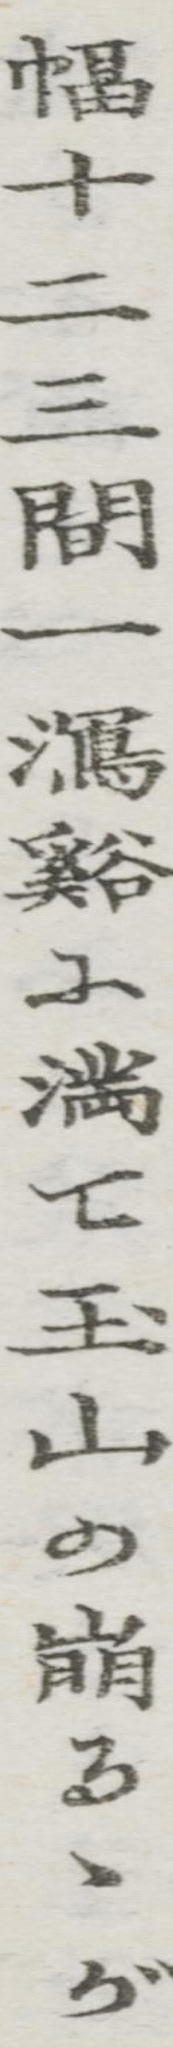幅十二三間一瀉谿に満て玉山の崩るヽが
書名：塩原繁昌記　全
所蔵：東京大学地震研究所図書室 Earthquake Research Institute Library, The University of Tokyo, JAPAN
